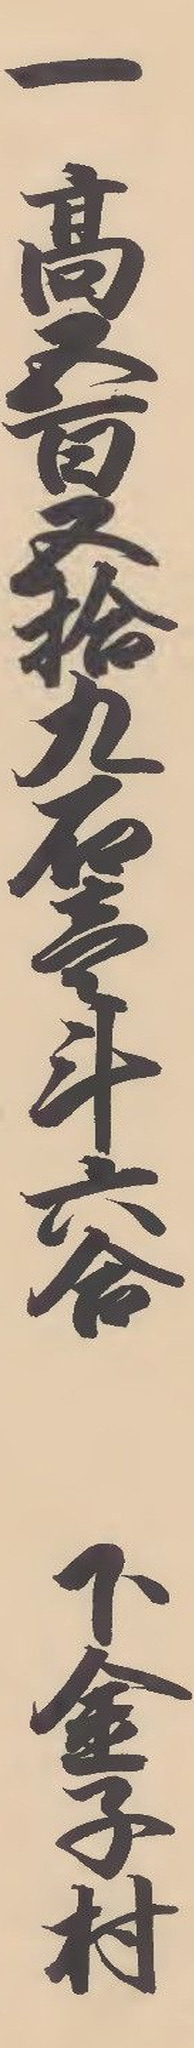一高五百五拾九石壱斗六合下金子村
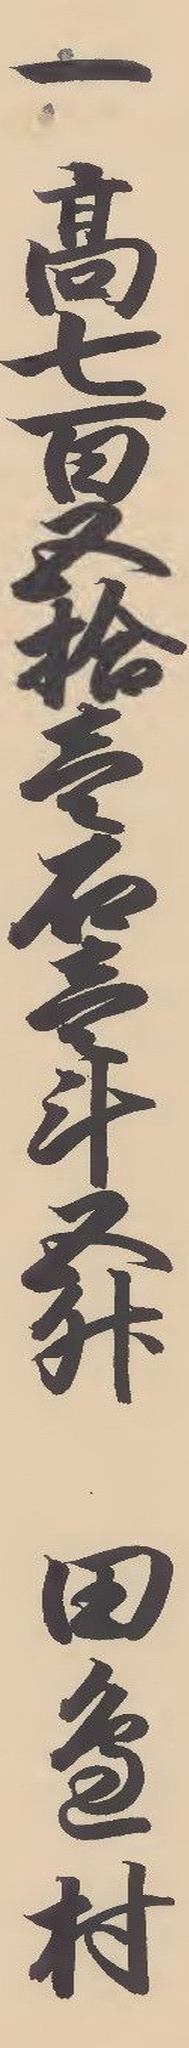一高七百五拾壱石壱斗五升田辺村
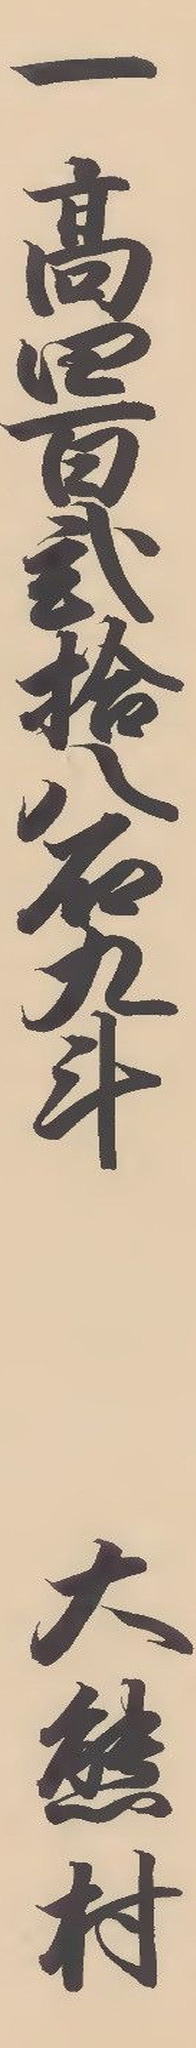一高四百弐拾八石九斗大熊村
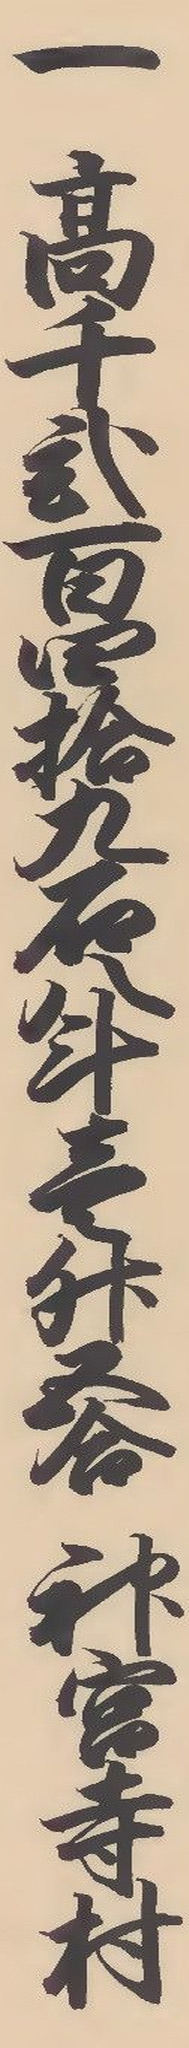一高千弐百四拾九石八斗壱升五合神宮寺村
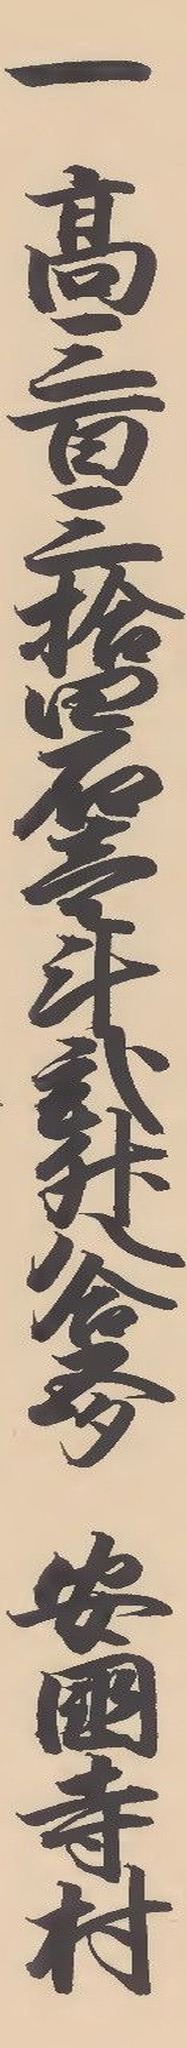一高三百三拾四石壱斗弐升八合五勺安国寺村
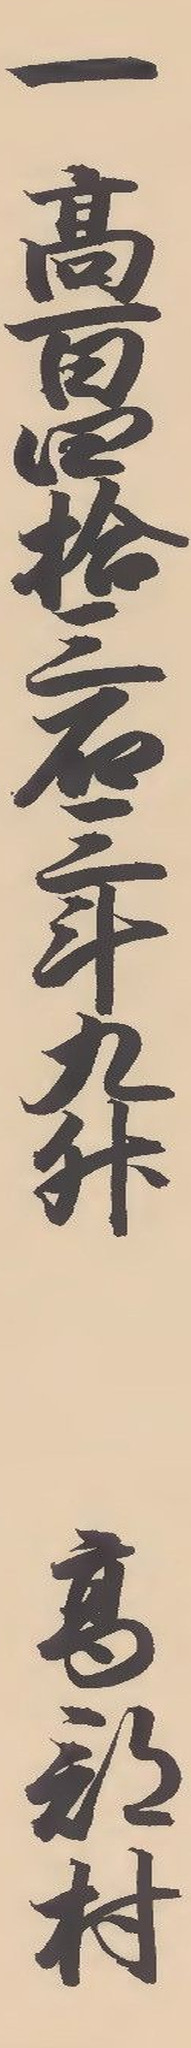一高百四拾三石三斗九升高部村
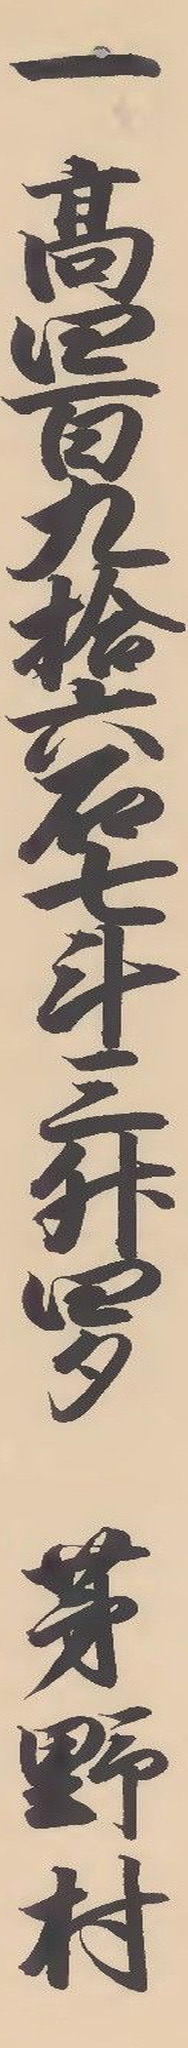一高四百九拾六石七斗三升四勺茅野村

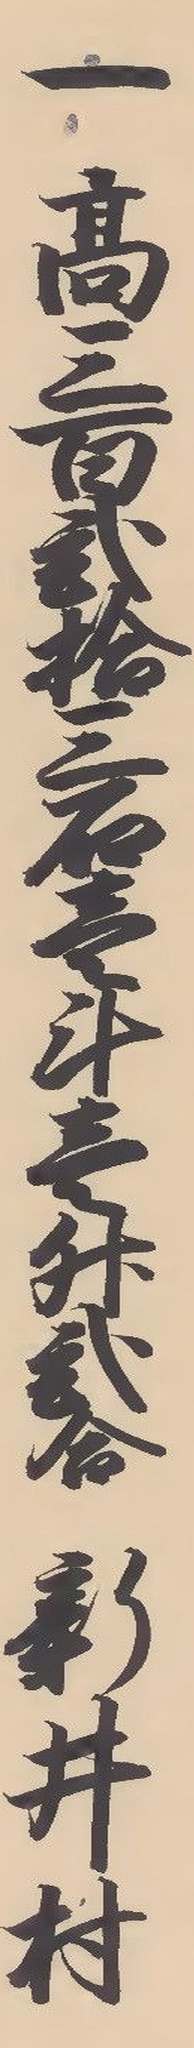一高三百弐拾三石壱斗壱升弐合新井村
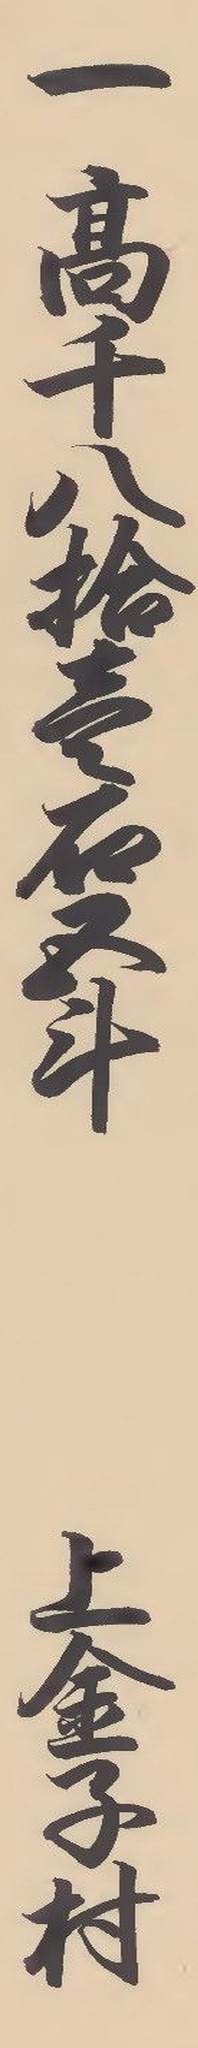一高千八拾壱石五斗上金子村
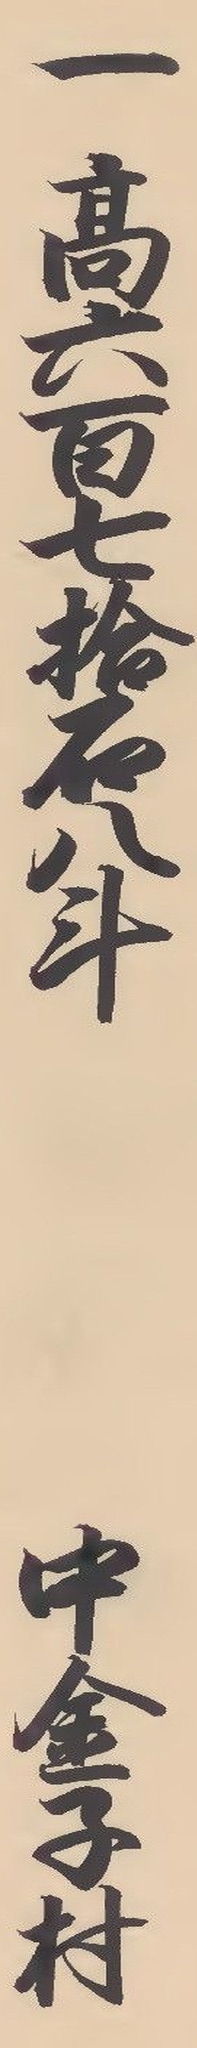一高六百七拾石八斗中金子村
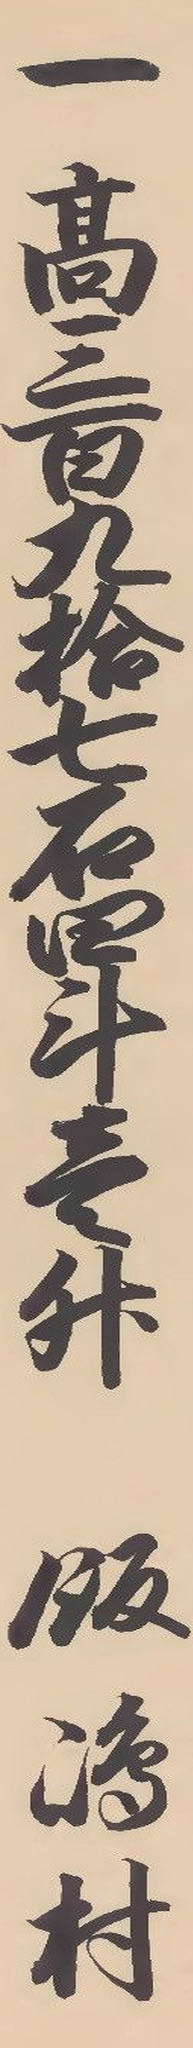一高三百九拾七石四斗壱升飯島村
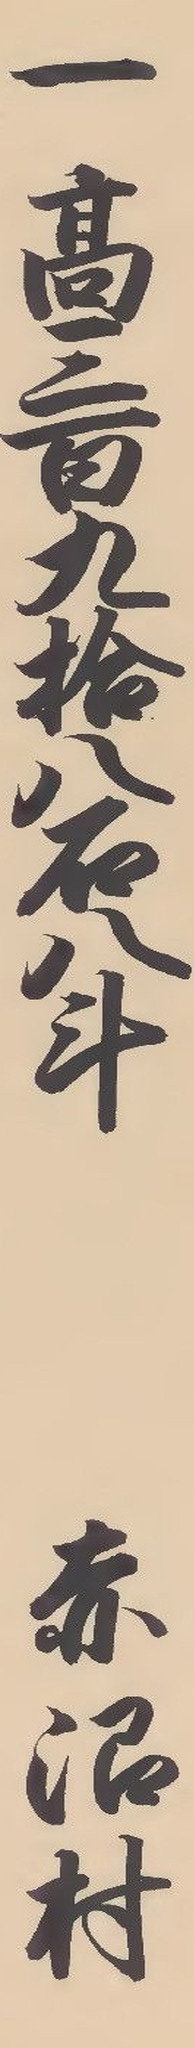一高三百九拾八石八斗赤沼村

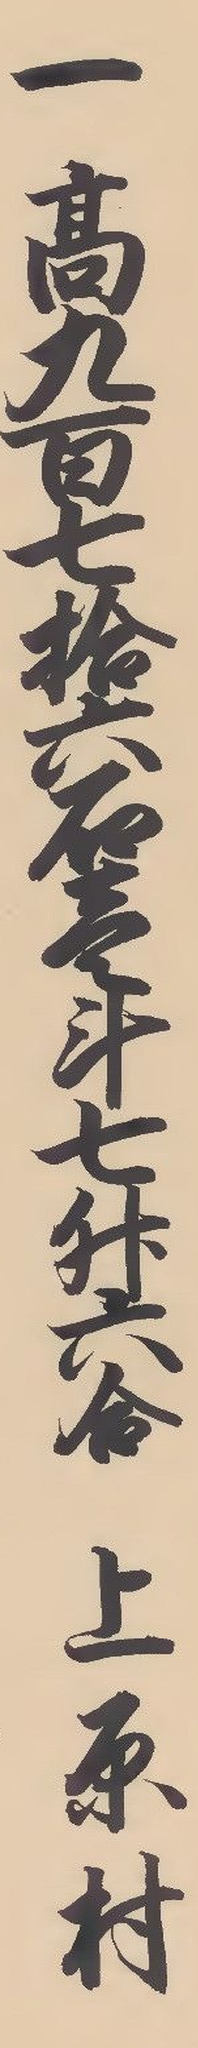一高九百七拾六石壱斗七升六合上原村
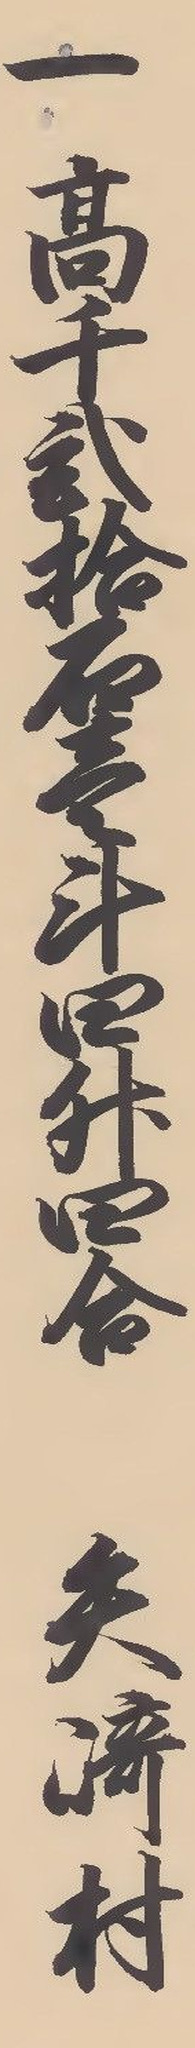一高千弐拾石壱斗四升四合矢崎村
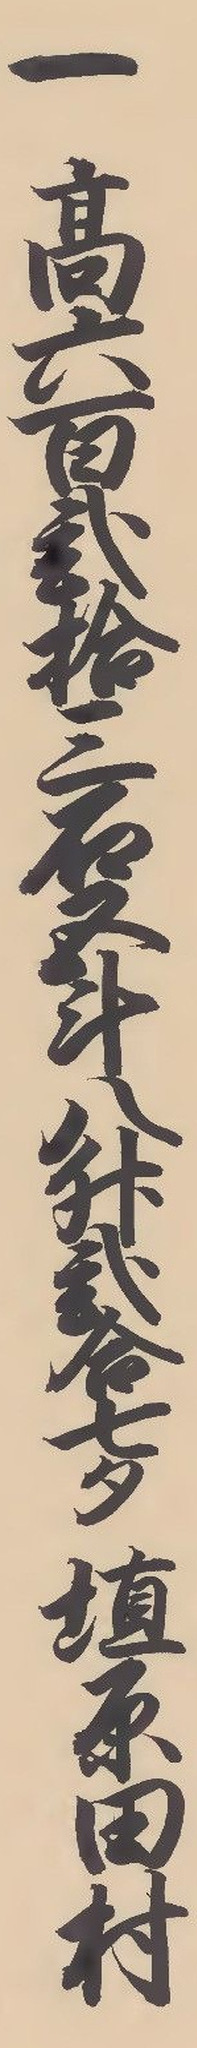一高六百弐拾三石五斗八升弐合七勺埴原田村
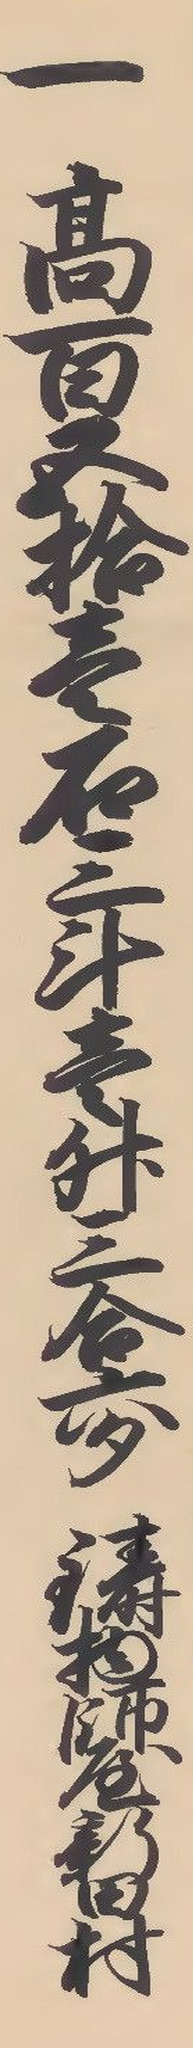一高百五拾壱石三斗壱升三合六勺鋳物師屋新田村
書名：信濃国郷帳
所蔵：国立公文書館 National Archives of Japan
